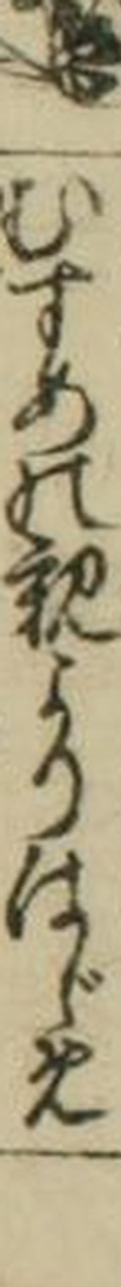むすめの親よりはじめ
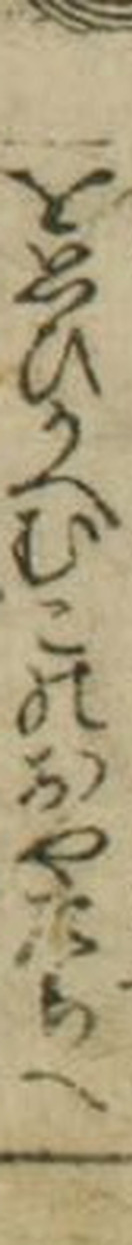を思ひかへむこのおやたちへ
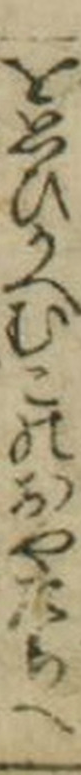を思ひかへむこのおやたちへ
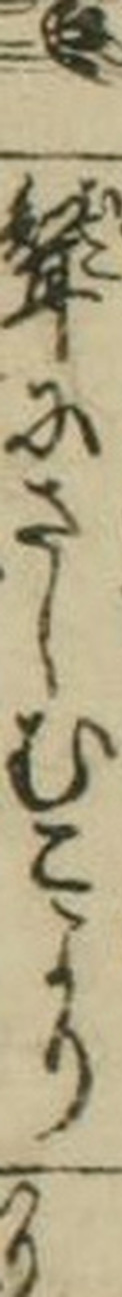聟にさしむこより
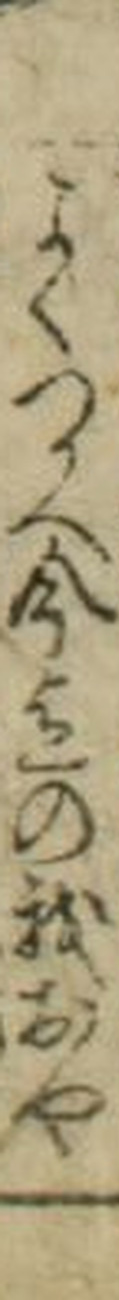よくつかへ今迄の我おや
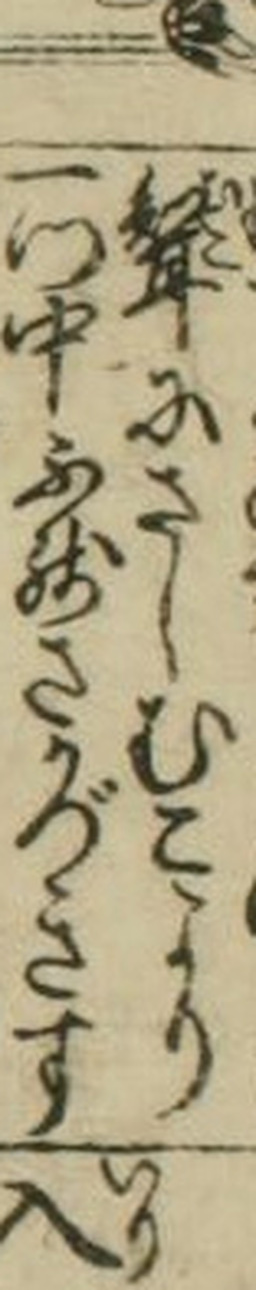一門中不残さかづきす
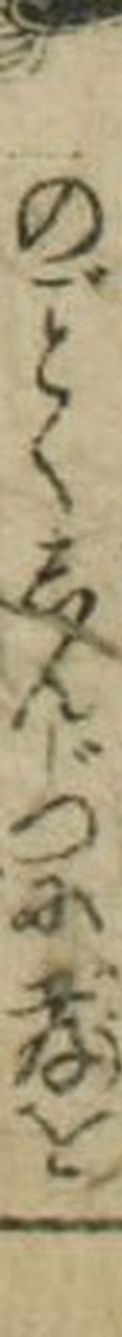のごとくしんじつに孝を
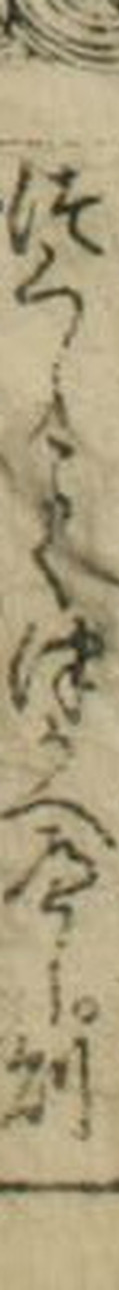つくしよくつかへへし。則
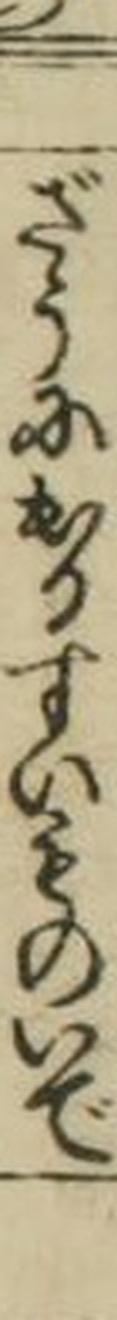ざうに出るすいものいで
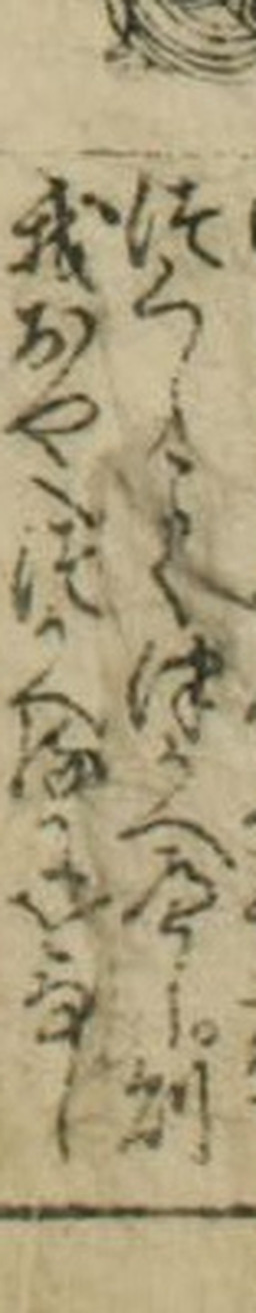我おやへつかへるにをなし
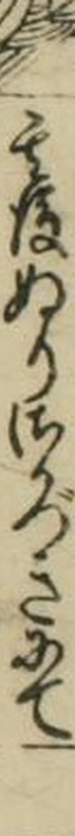其後ぬりさかづきにて
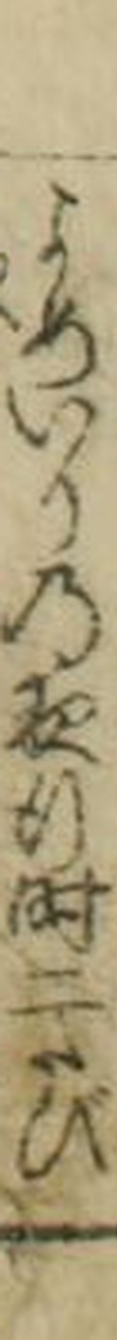よめいりの夜行時二たび
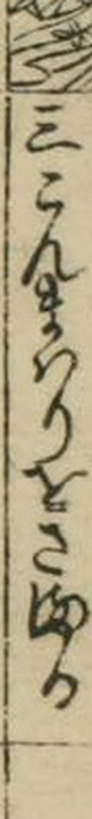三こんまはりをさまる
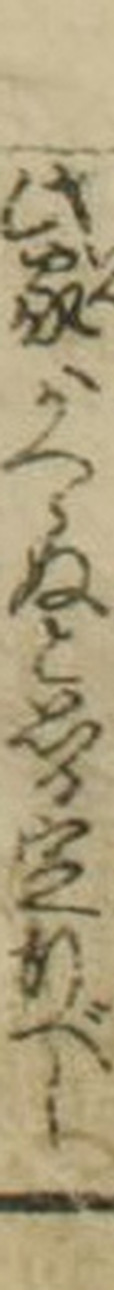此家へかへらぬと思ひ定行べし
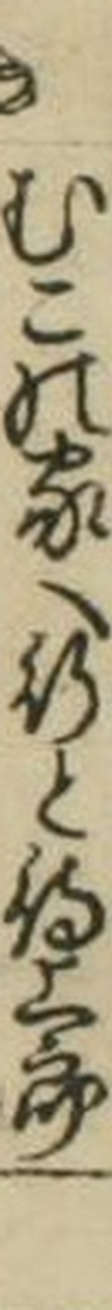むこの家へ行と待上郎
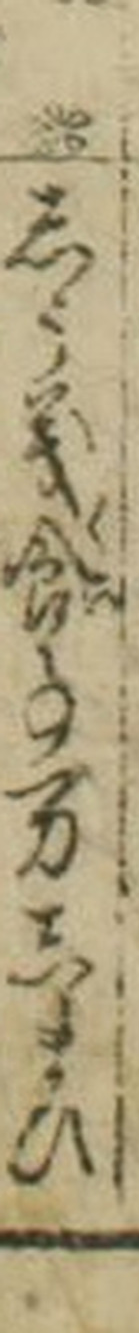しう義食事万しまひ
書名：女源氏教訓鑑
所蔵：東京学芸大学附属図書館
